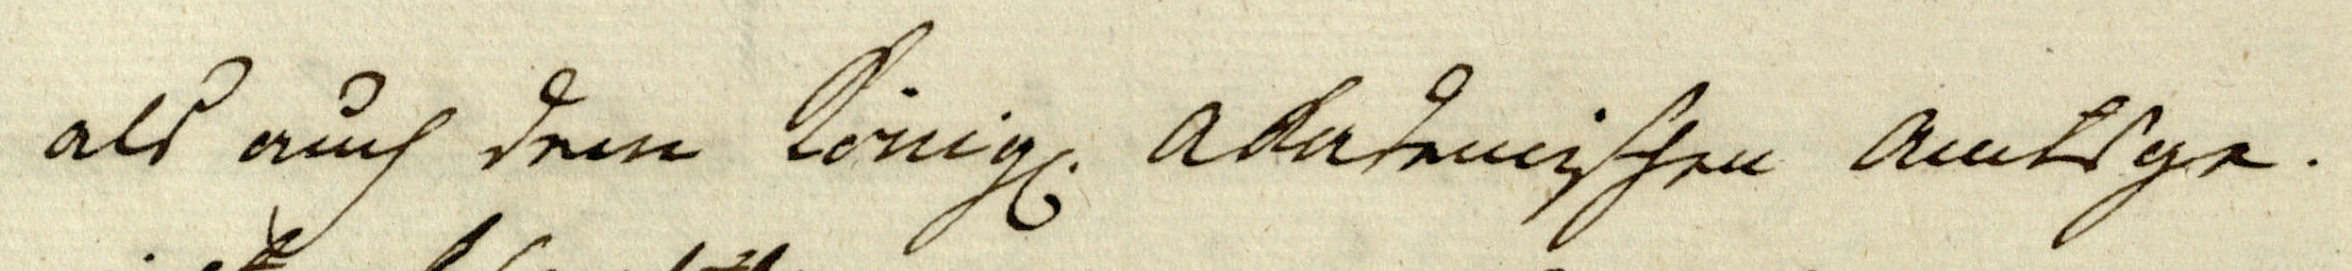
als auch dem Königl. Akademischen Amtsge¬
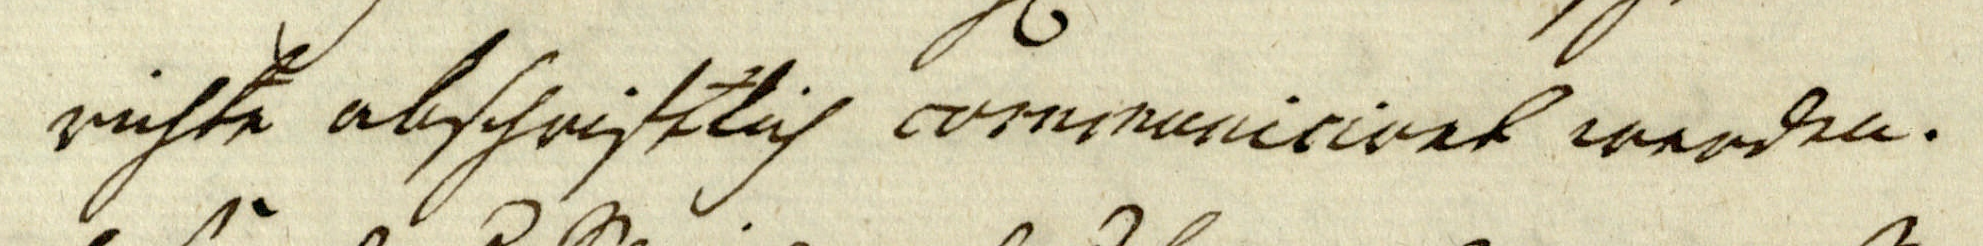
richte abschriftlich communiciret werden.
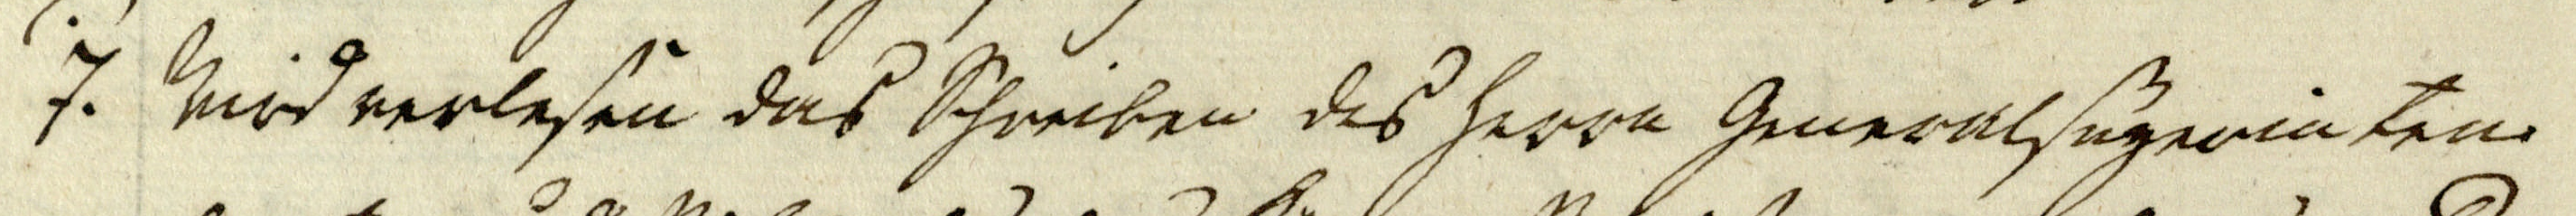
7. Wird verlesen das Schreiben des Herrn Generalsuperinten¬
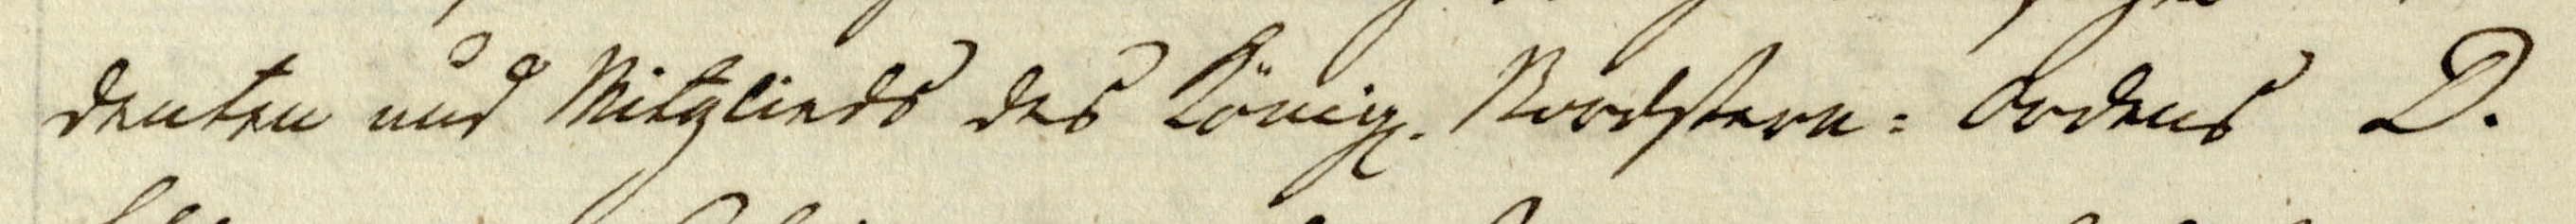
denten und Mitglieds des Königl. Nordstern- Ordens D.
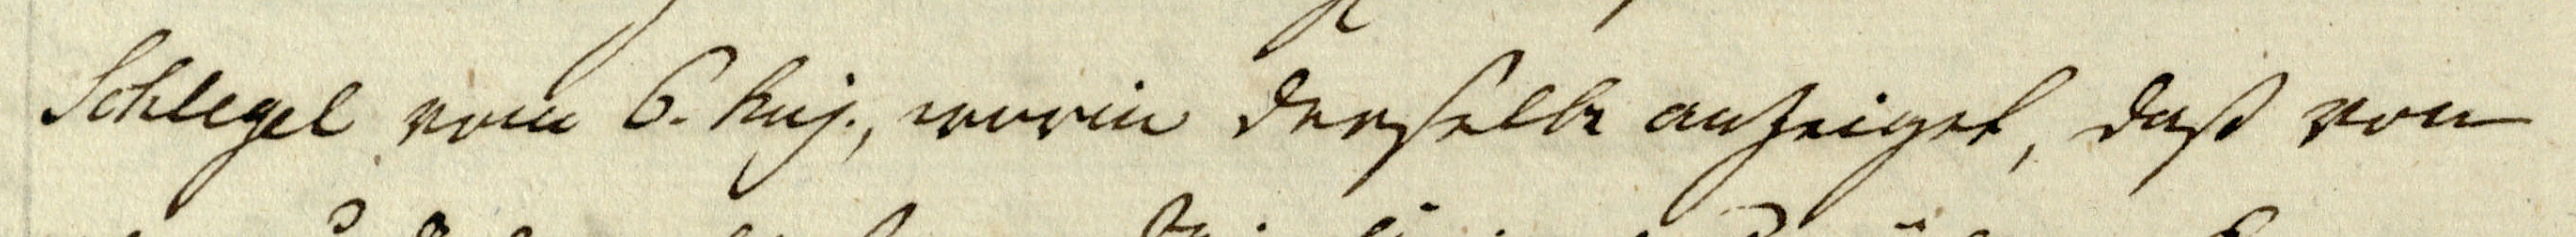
Schlegel vom 6. huj., worin derselbe anzeiget, daß von
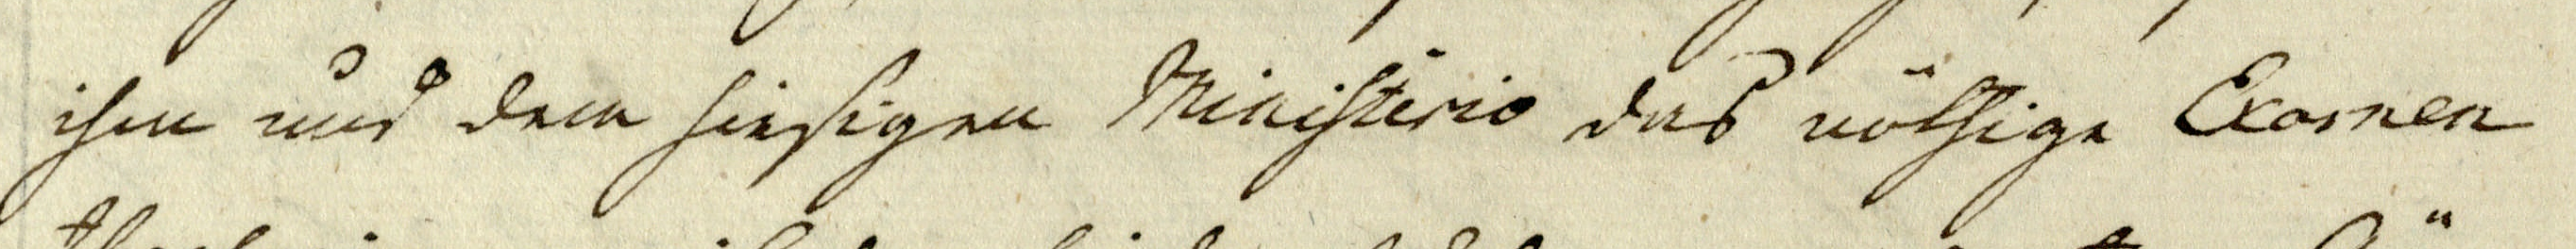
ihm und dem hiesigen Ministerio das nöthige Examen
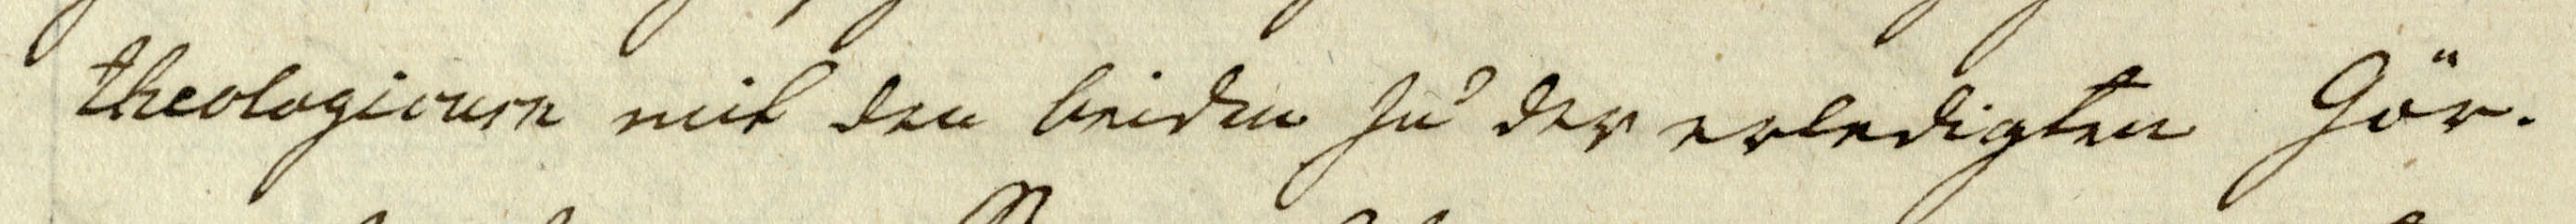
theologicum mit den beiden zu der erledigten Gör¬
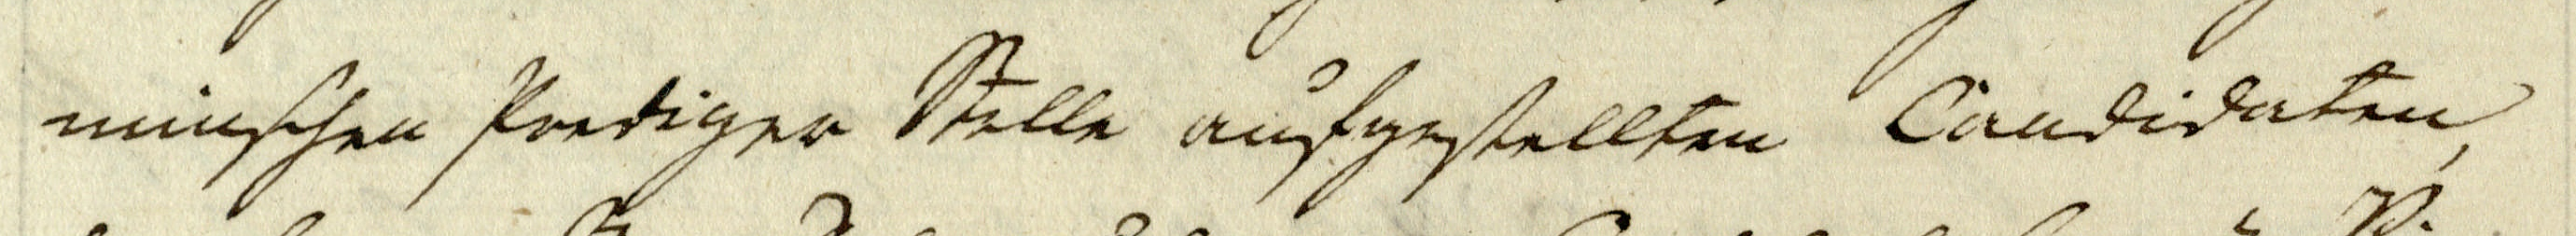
minschen Prediger Stelle aufgestellten Candidaten,
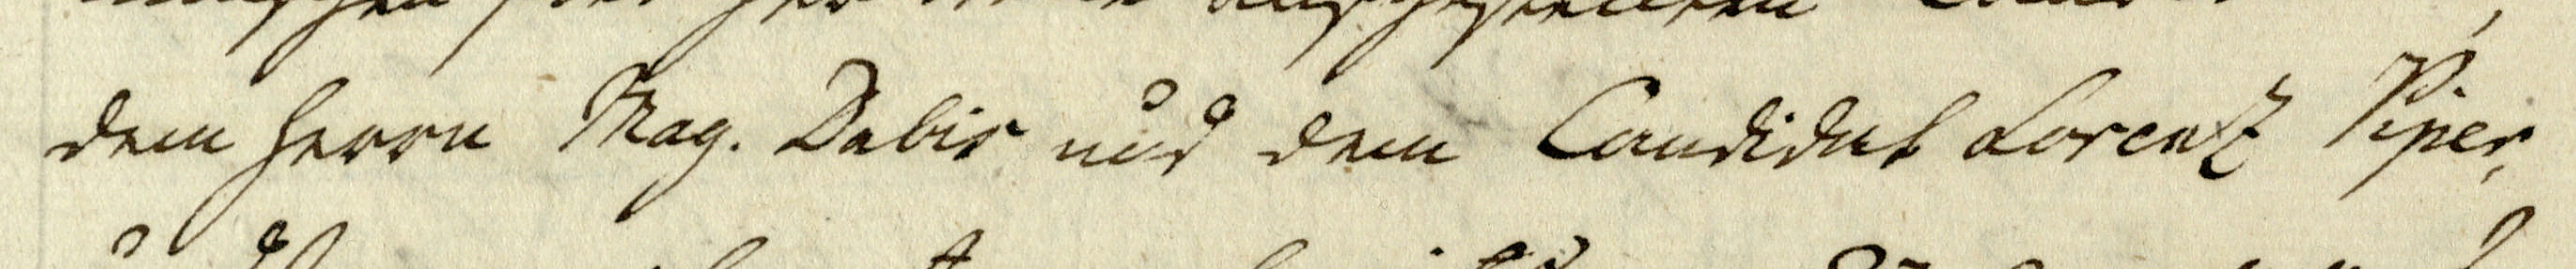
dem Herrn Mag. Dabis und dem Candidat Lorenz Piper,
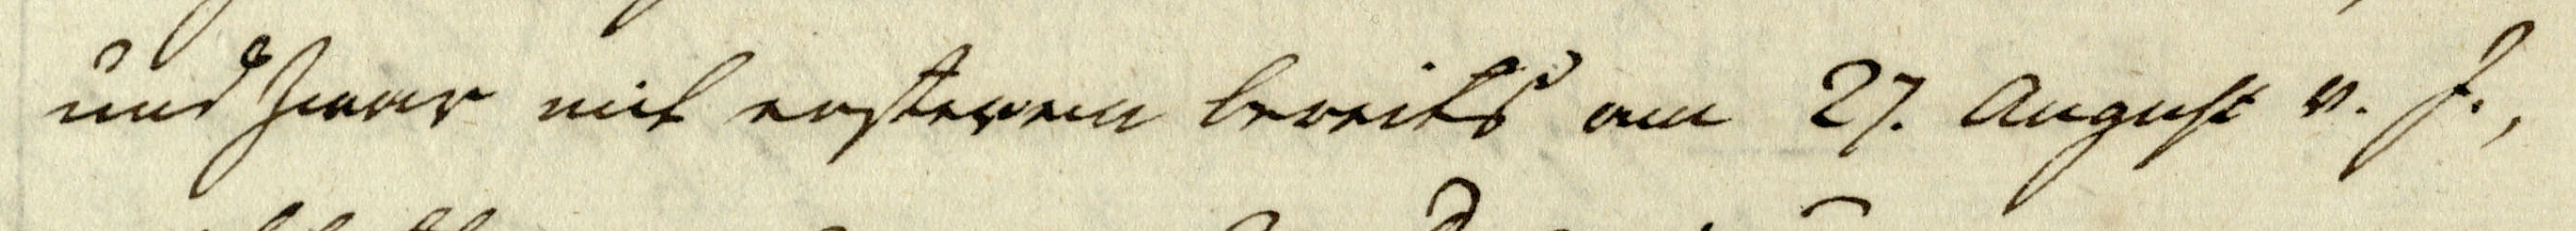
und zwar mit ersterem bereits am 27. August v. J.,
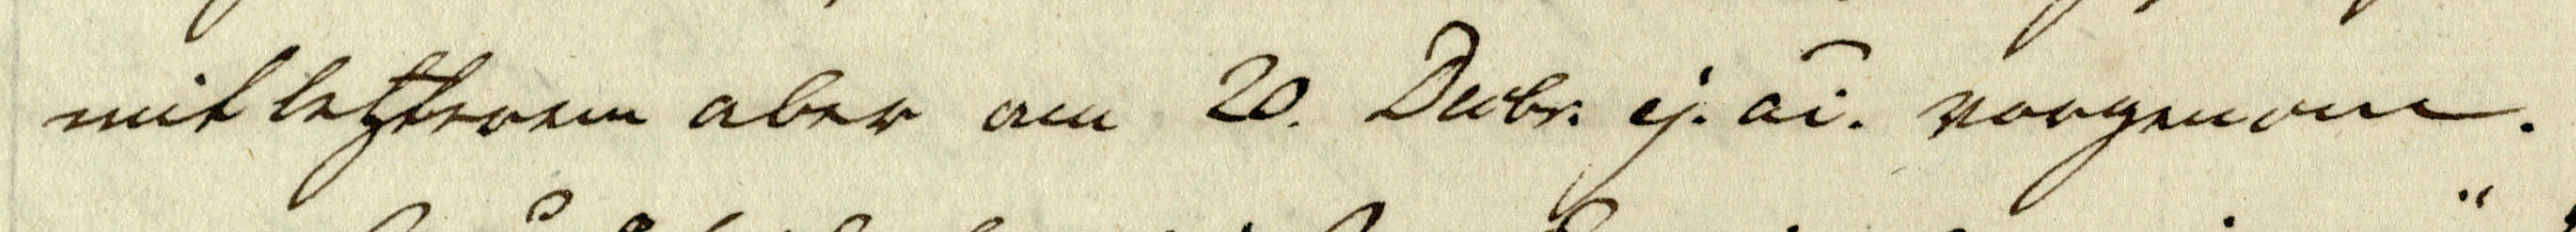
mit letzterem aber am 20. Decbr. ej. ai. vorgenom¬
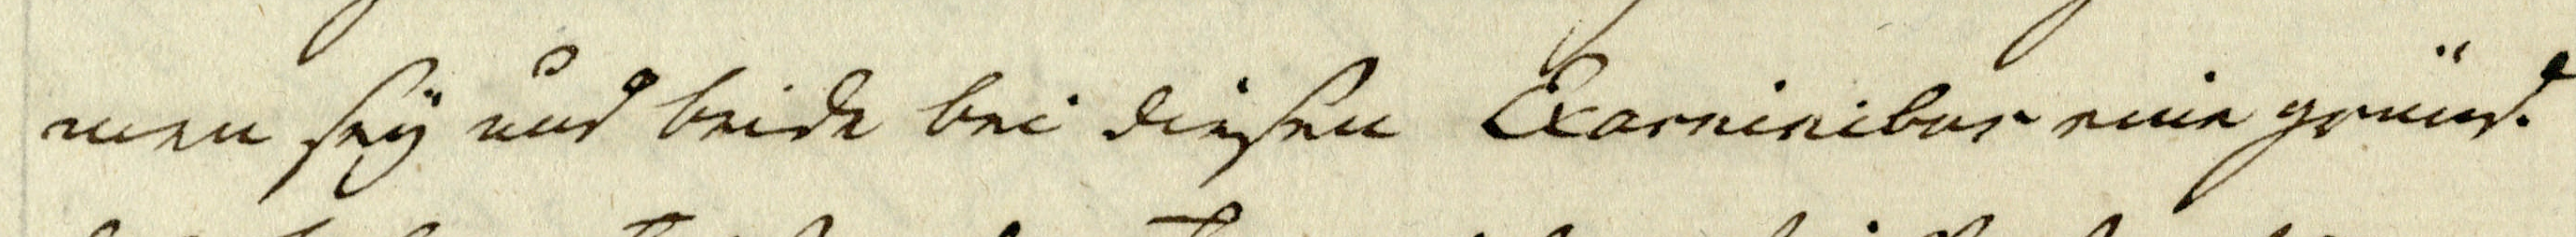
men seÿ und beide bei diesem Examinibus eine gründ¬
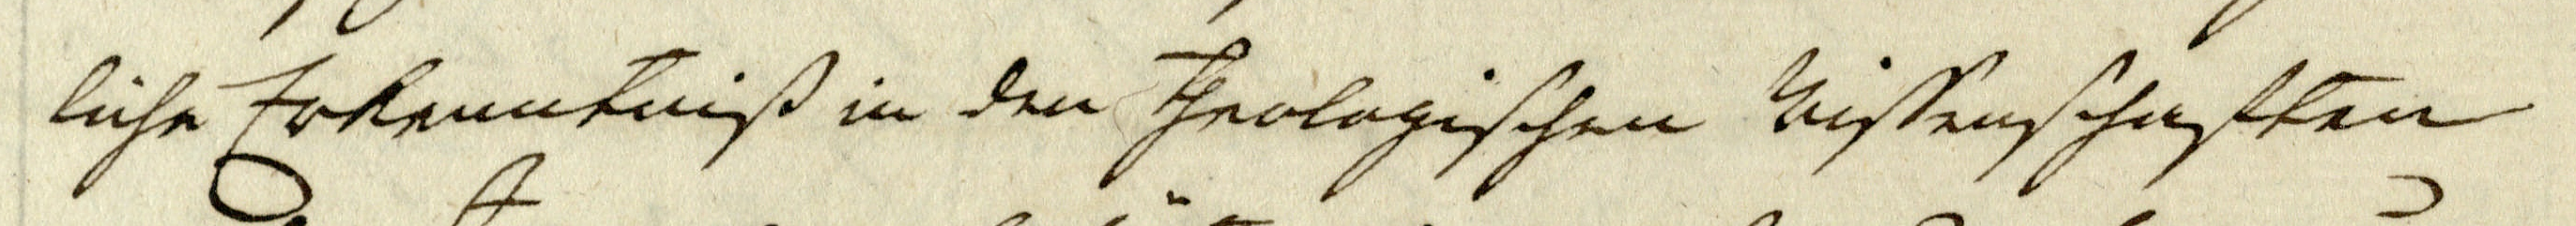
liche Erkenntniß in den Theologischen Wissenschaften
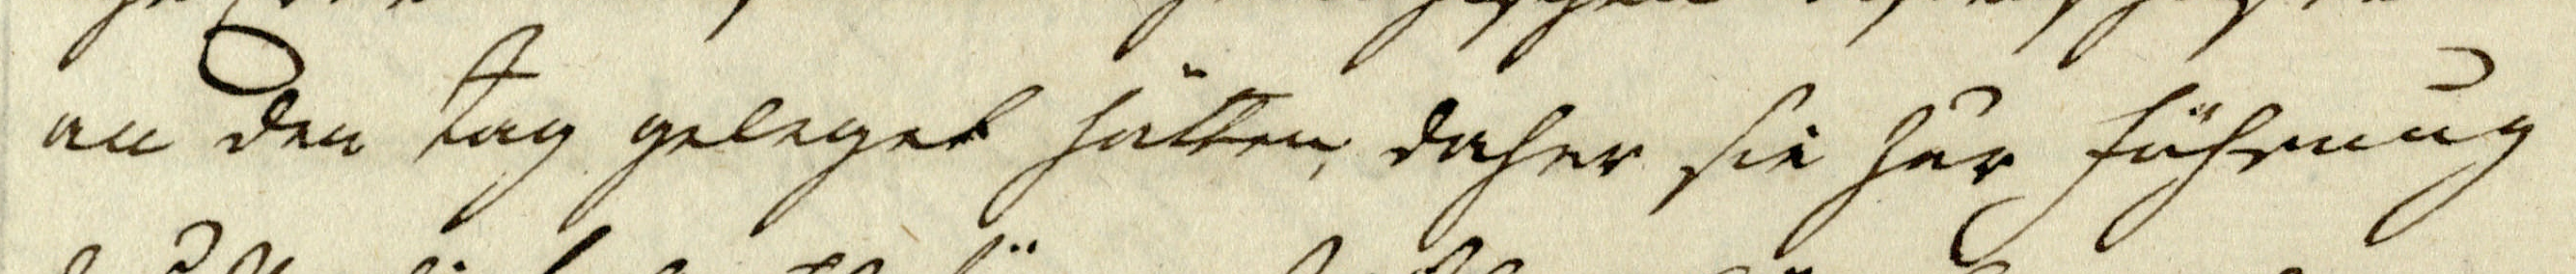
an den Tag geleget hätten, daher sie zur Führung
